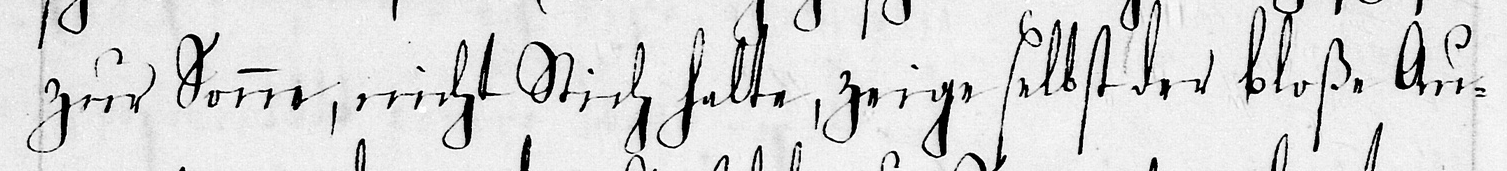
zur Sonne, nicht Stich halte, zeige selbst der bloße Au¬
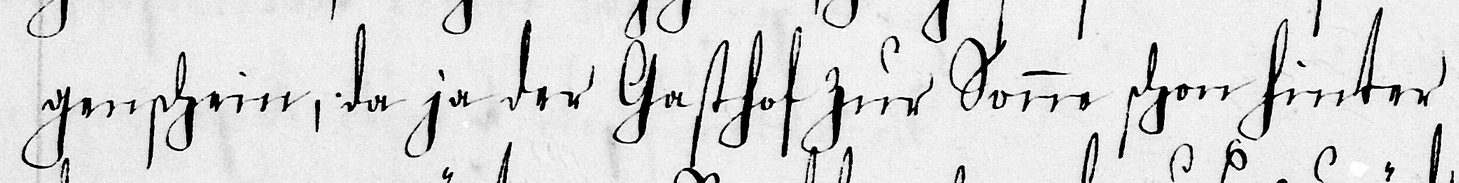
genschein, da ja der Gasthof zur Sonne schon hinter
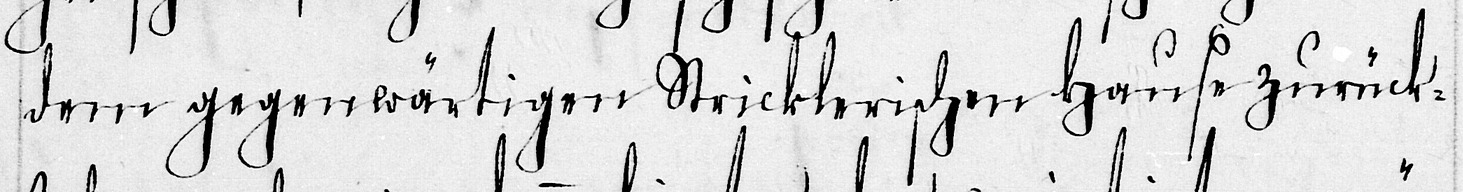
dem gegenwärtigen Stricklerischen Hause zurück¬
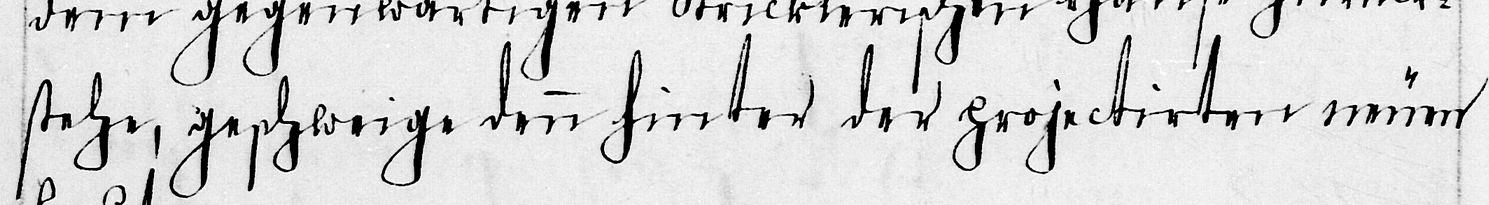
stehe, geschweige denn hinter der projectirten neuen
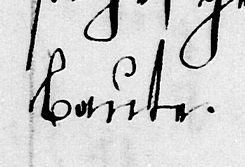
Baute.
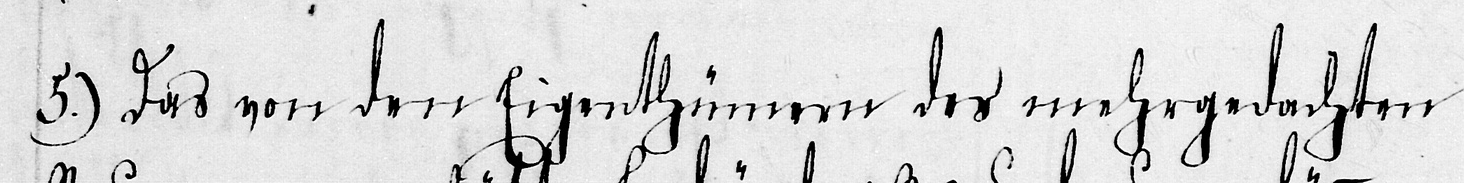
5.) Das von dem Eigenthümern des mehrgedachten
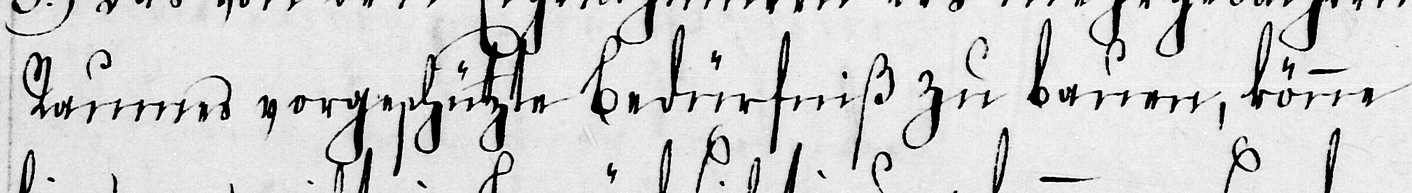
Raumes vorgeschützte Bedürfniß zu bauen, könne
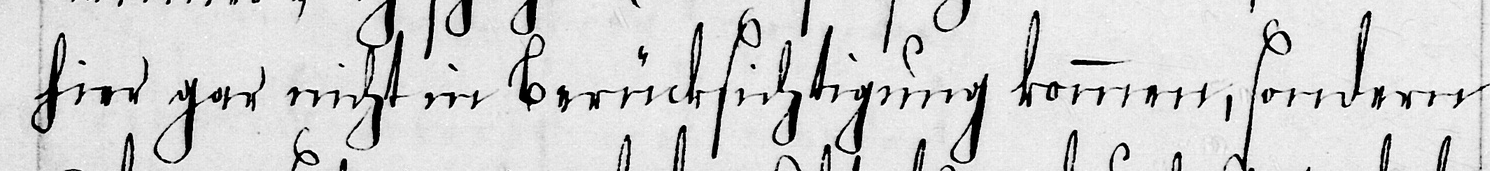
hier gar nicht in Berücksichtigung kommen, sondern
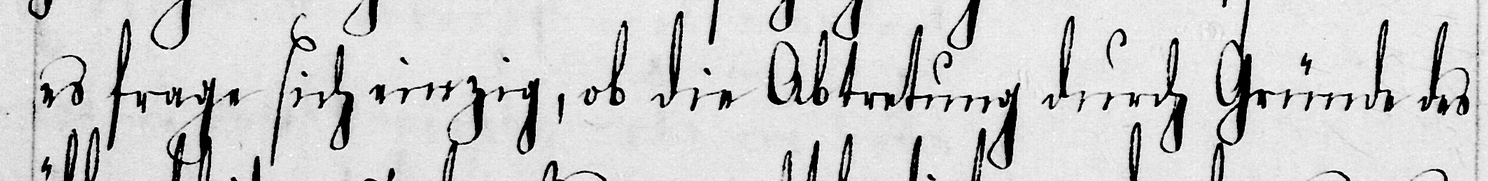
es frage sich einzig, ob die Abtretung durch Gründe des
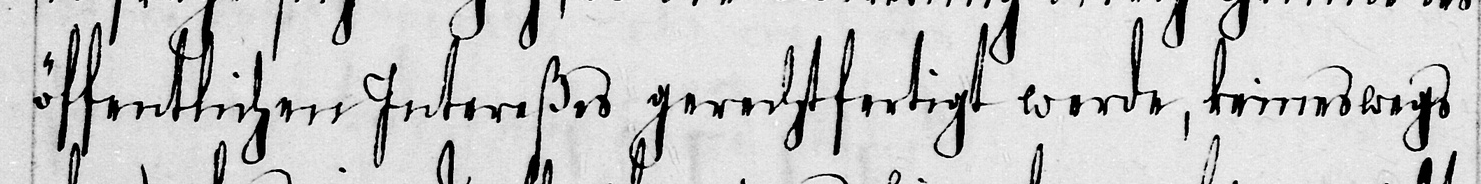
öffentlichen Intereßes gerechtfertigt werde, keineswegs
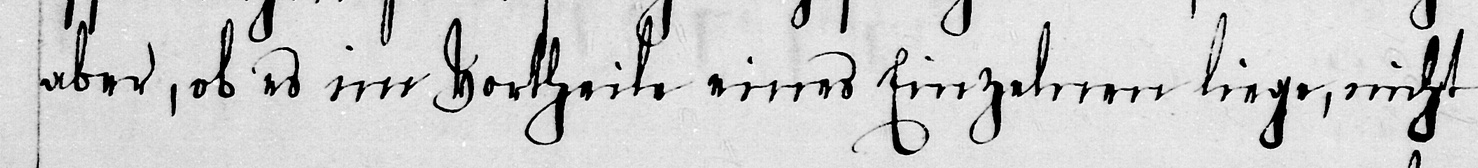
aber, ob es im Vortheile eines Einzelnen liege, nicht
